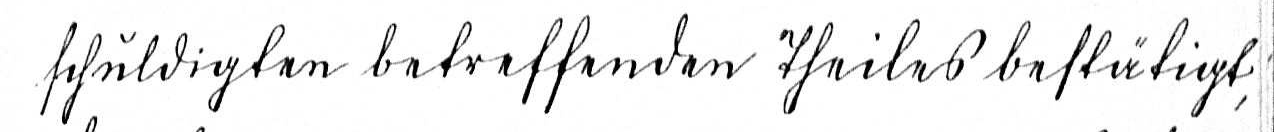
schuldigten betreffenden Theiles bestätigt,
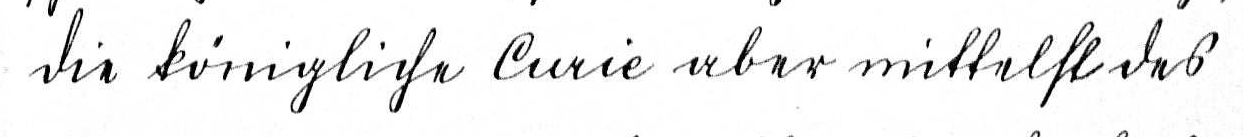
die königliche Curie aber mittelst des
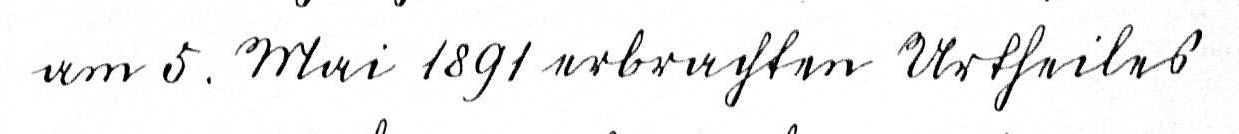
am 5. Mai 1891 erbrachten Urtheiles
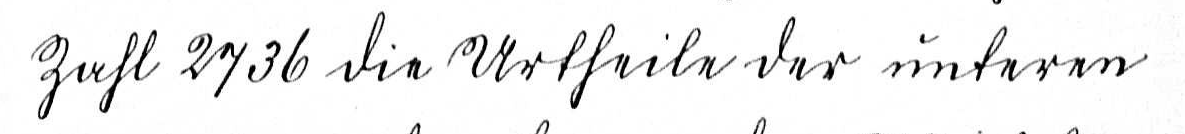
Zahl 2736 die Urtheile der unteren
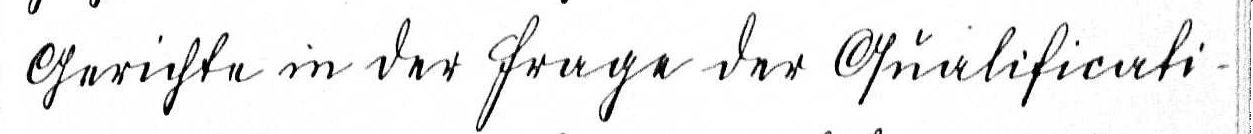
Gerichte in der Frage der Qualificati¬
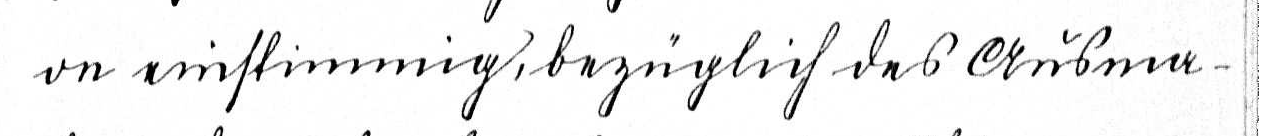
on einstimmig, bezüglich des Ausma¬
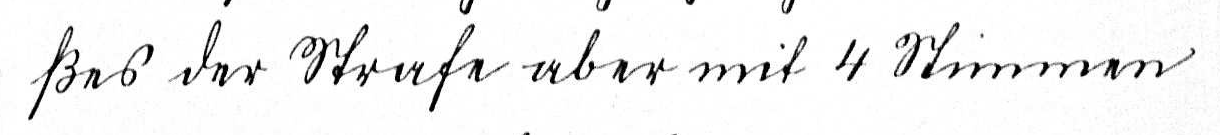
ßes der Strafe aber mit 4 Stimmen
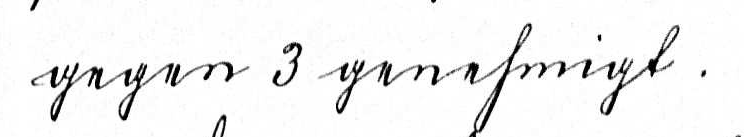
gegen 3 genehmigt.
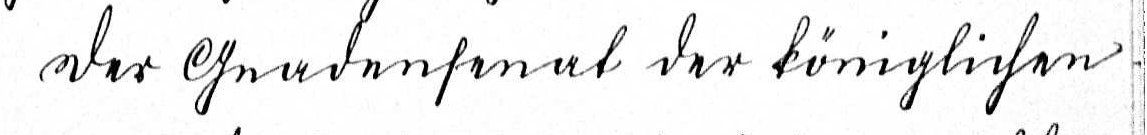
Der Gnadensenat der königlichen
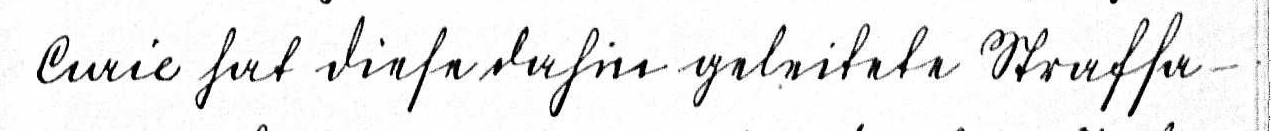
Curie hat diese dahin geleitete Strafsa¬
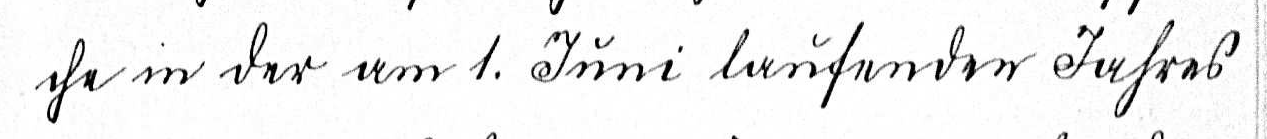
che in der am 1. Juni laufender Jahres
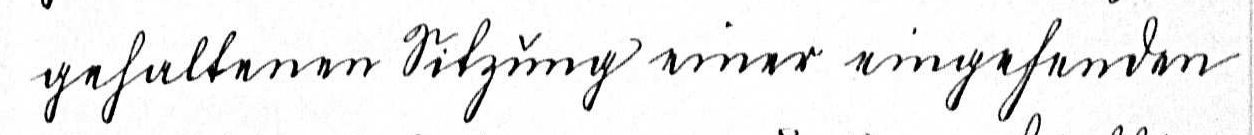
gehaltenen Sitzung einer eingehenden
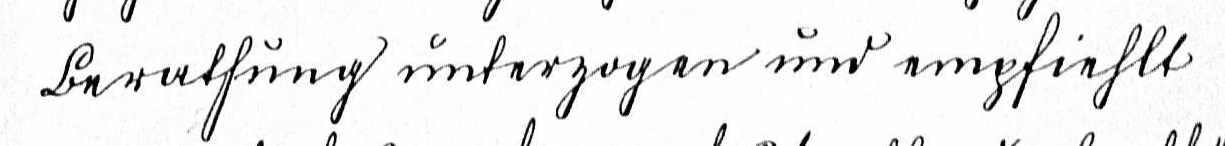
Berathung unterzogen und empfiehlt
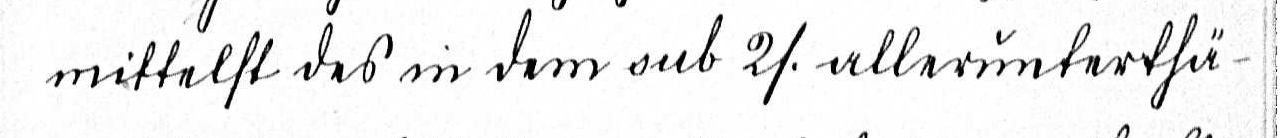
mittelst des in dem sub 2) allerunterthä¬
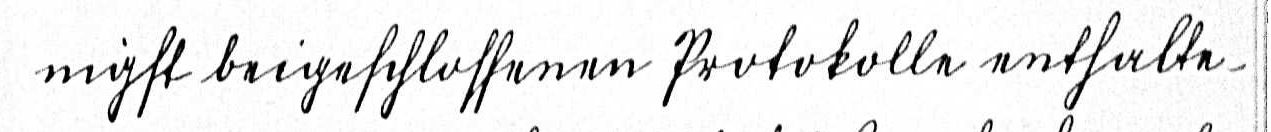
nigst begeschlossenen Protokolle enthalte¬
